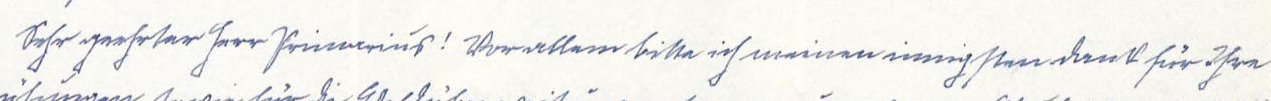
Sehr geehrter Herr Primarius! Vor allem bitte ich meinen innigsten Dank für Ihre
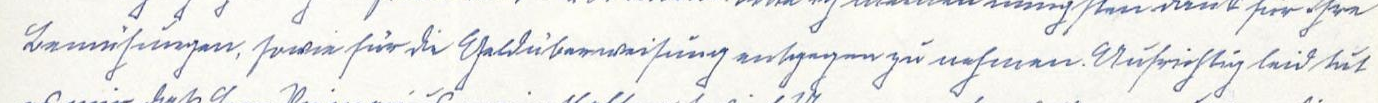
Bemühungen, sowie für die Geldüberweisung entgegen zu nehmen. Aufrichtig Leid tut
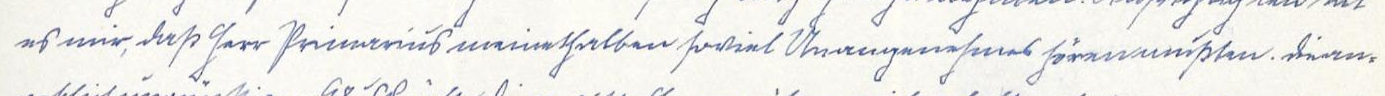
es mir, das Herr Primarius meinethalben soviel Unangenehmes hörenmußten. Die
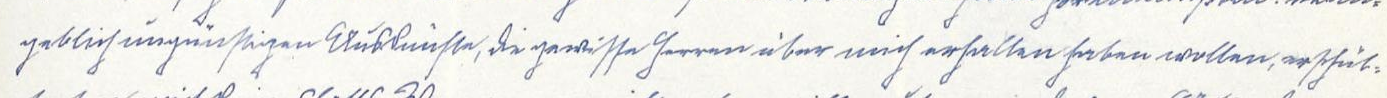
angeblich ungünstigen Auskünfte, die gewisse Herrn über mich erhalten haben wollen, erschüt-
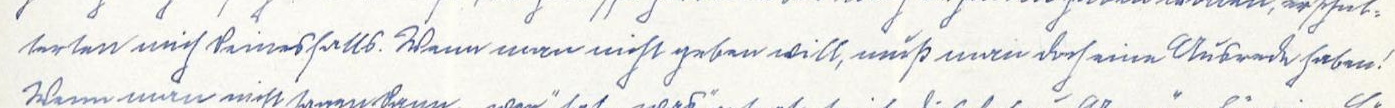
terten mich keinesfalls. Wenn man nicht geben will, muss man doch eine Ausrede haben!
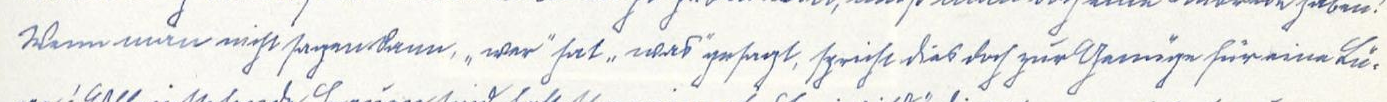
Wenn man nicht sagen kann, "wer" hat "was" gesagt, spricht dies doch zur Genüge für eine Lü-
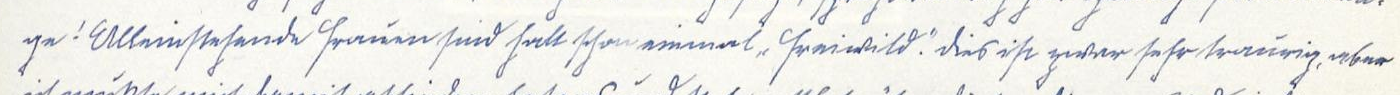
ge! Alleinstehende Frauen sind hat schon einmal "Freiwild". Dies ist zwar sehr traurig, aber
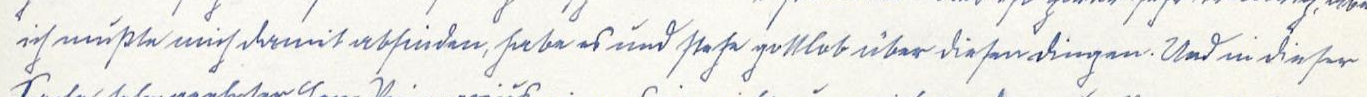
ich musste mich damit abfinden, habe es und stehe gottlob über diesen Dingen. Und in dieser
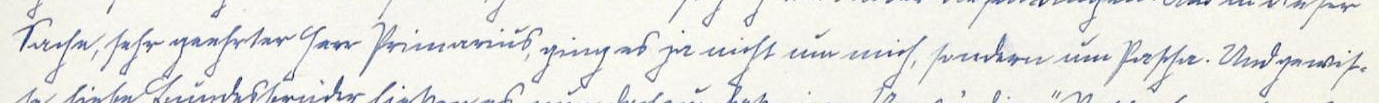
Sache, sehr geehrter Herr Primarius, ging es ja nicht um mich, sondern um Pascha. Und gewis-
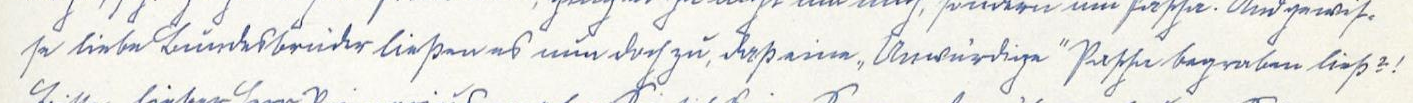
se liebe Bundesbrüder ließen es nun doch zu, daß eine, „Unwürdige" Pascha begraben ließ?
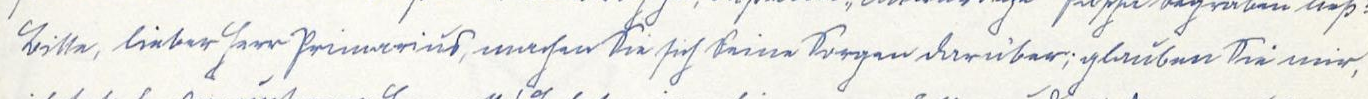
Bitte, lieber Herr Primarius, machen Sie sich keine Sorgen darüber; Glauben Sie mir,
